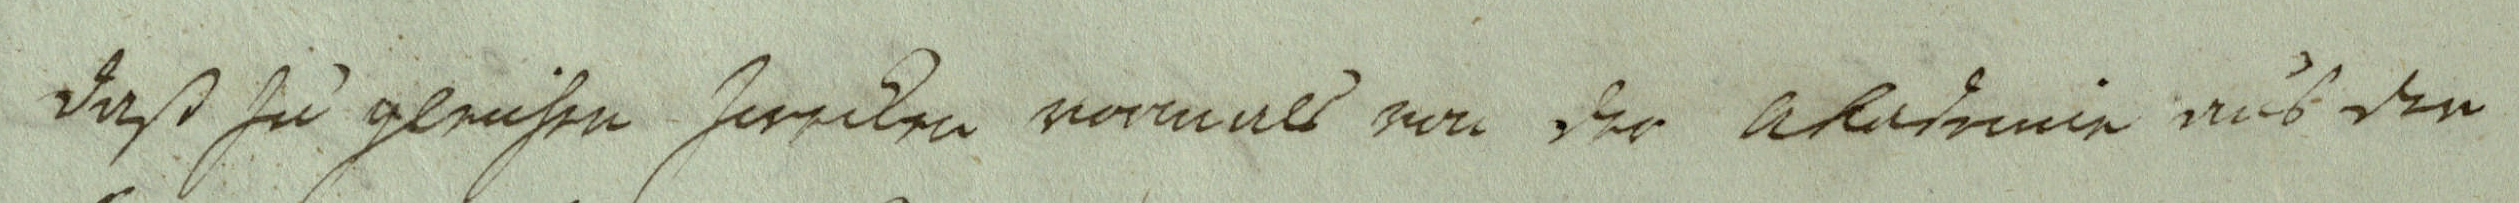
daß zu gleichen Zwecken vormals von der Akademie aus der
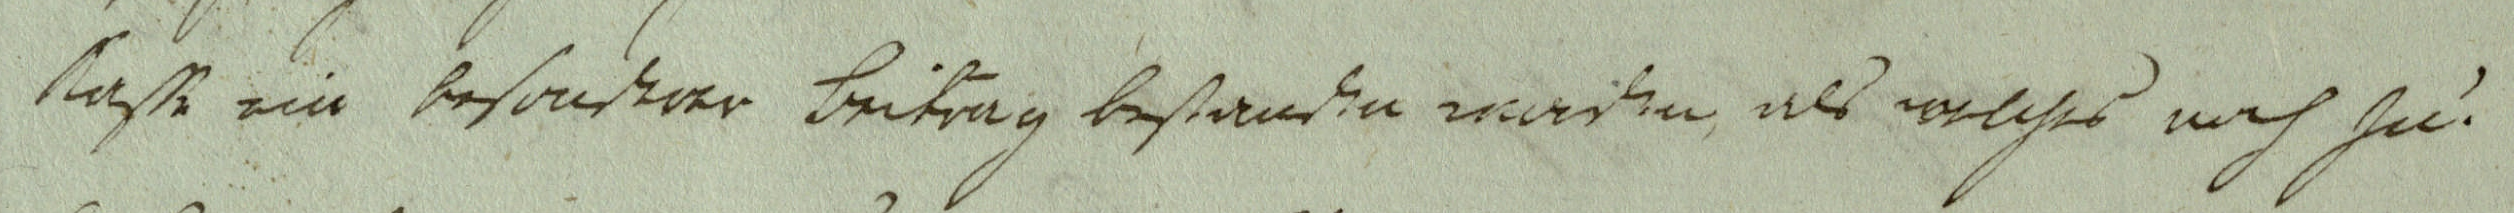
Kasse ein besonderer Beitrag bestanden worden, als welcher noch zu¬
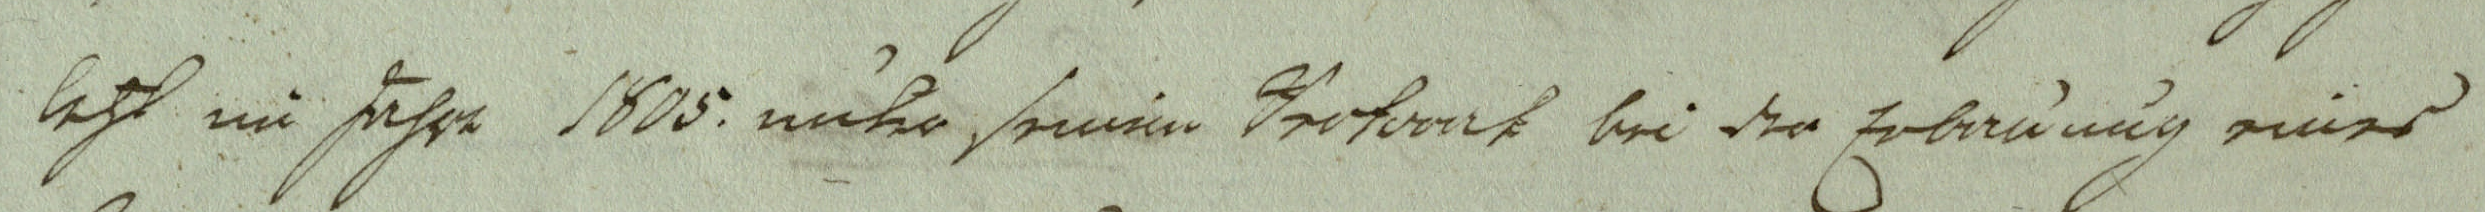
letzt im Jahre 1805. unter seinem Rectorat bei der Erbauung eines
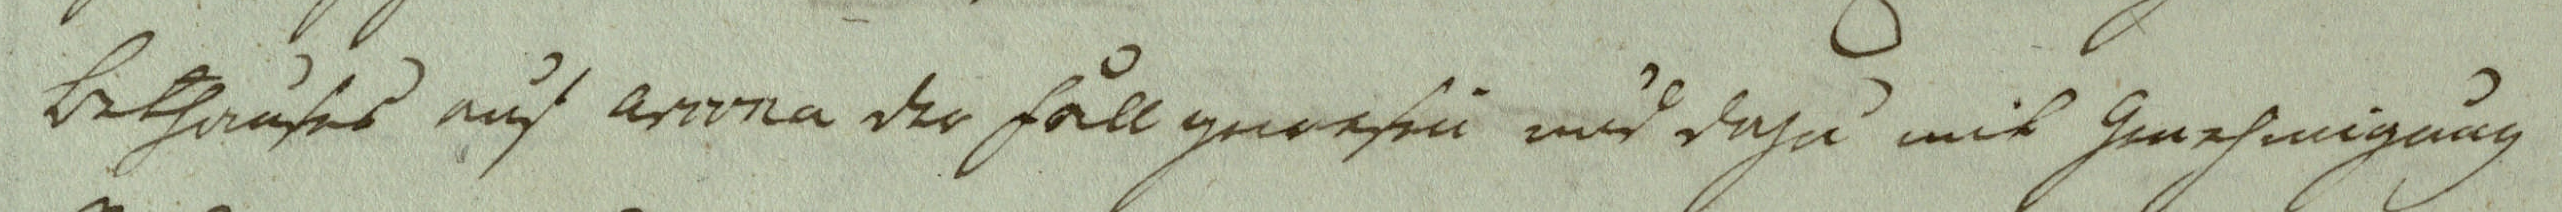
Bethauses auf Arcona der Fall gewesen und dazu mit Genehmigung
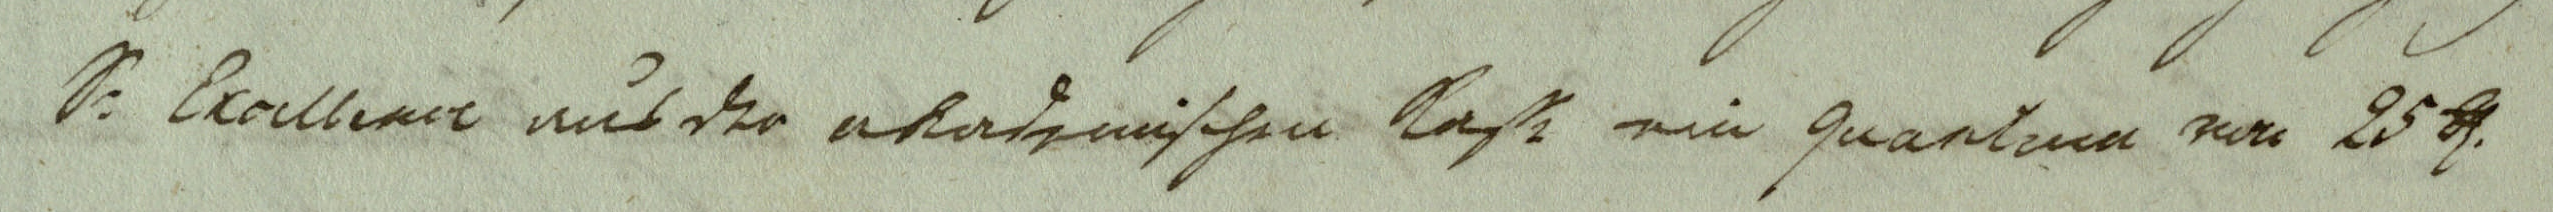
Sr. Excellence aus der akademischen Kasse ein Quantum von 25 Rt.
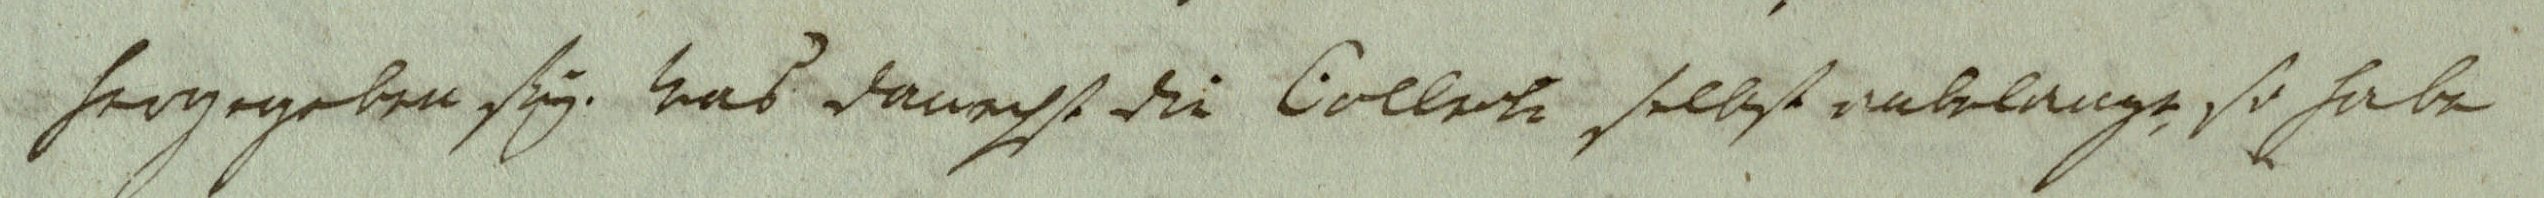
hergegeben seÿ. Was danechst die Collecte selbst anbelange, so habe
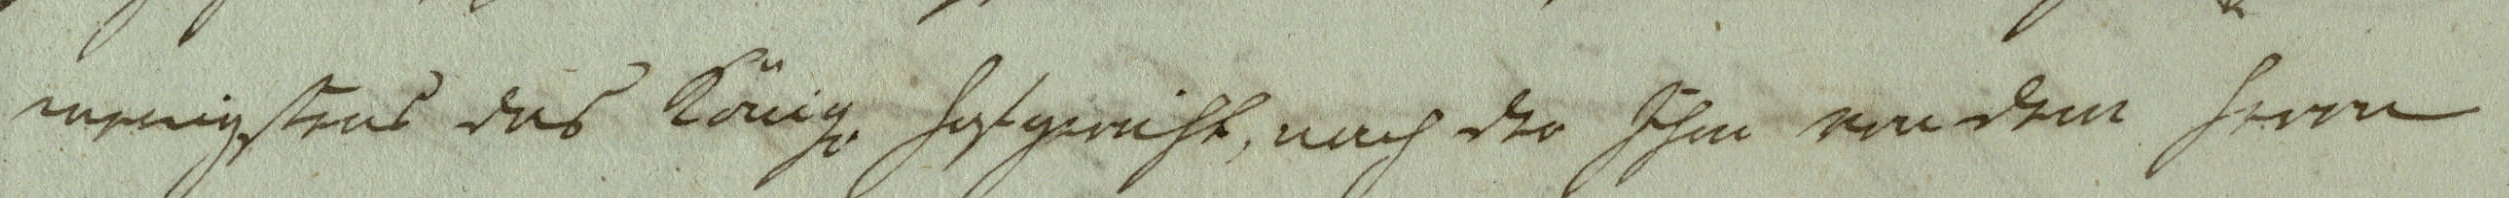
wenigstens das Königl. Hofgericht, nach der Ihm von dem Herrn
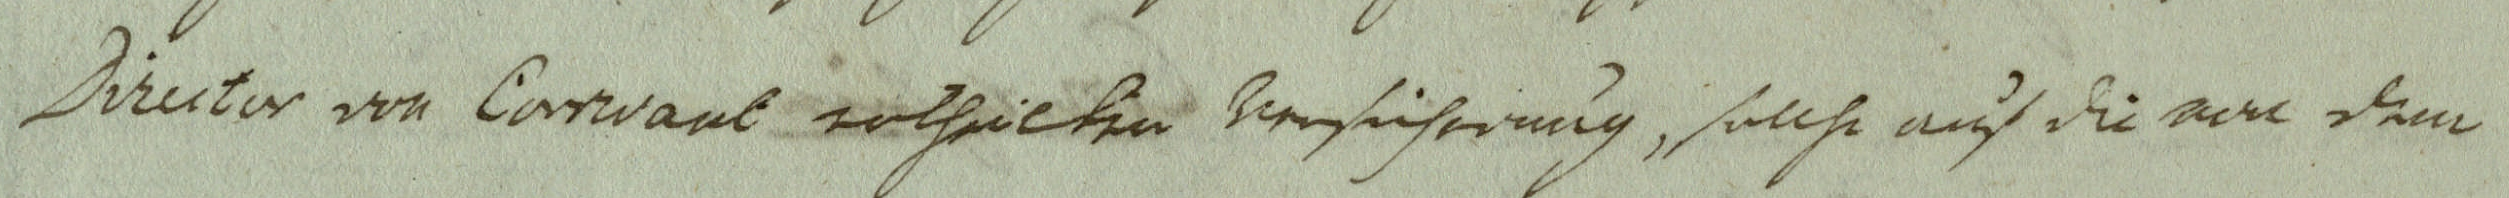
Director von Corswant ertheilten Versicherung, solche auf die von dem
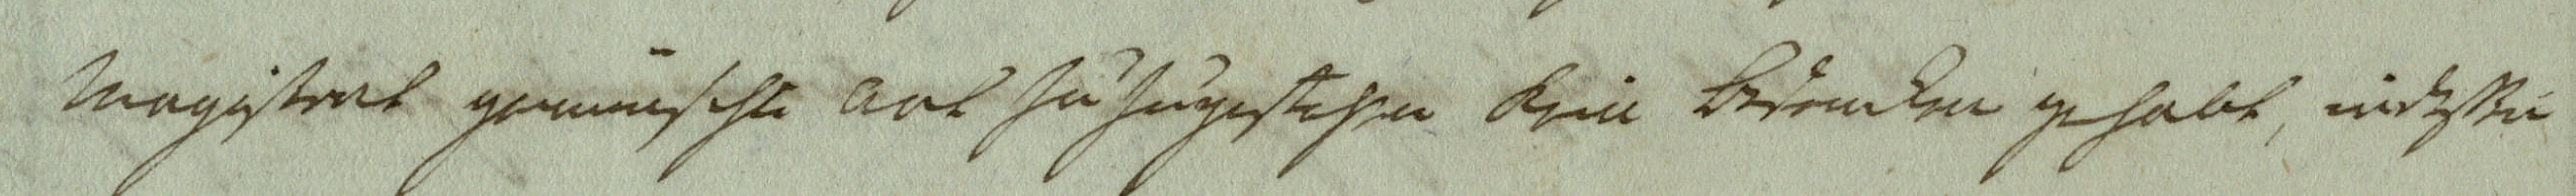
Magistrat gewünschte Art zuzugestehen kein Bedencken gehabt, indessen
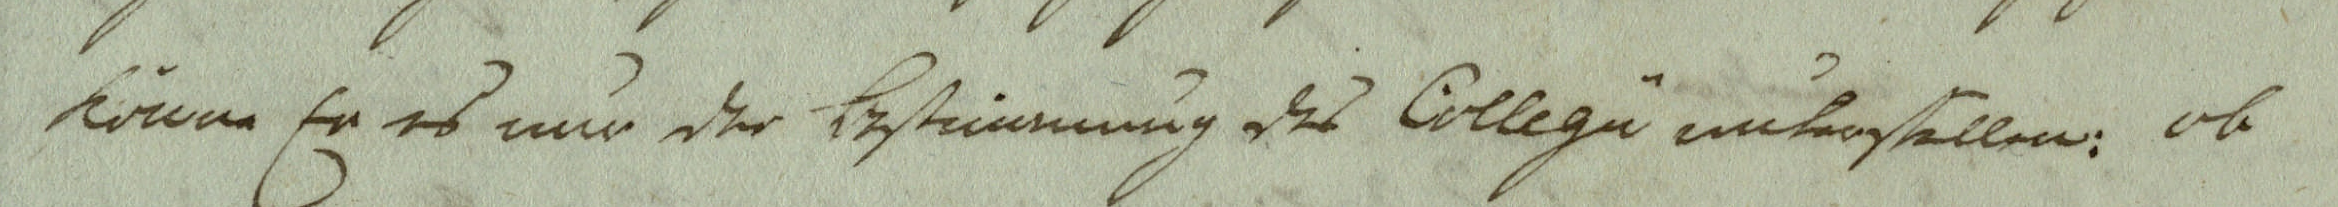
könne Er es nur der Bestimmung des Collegii unterstellen, ob
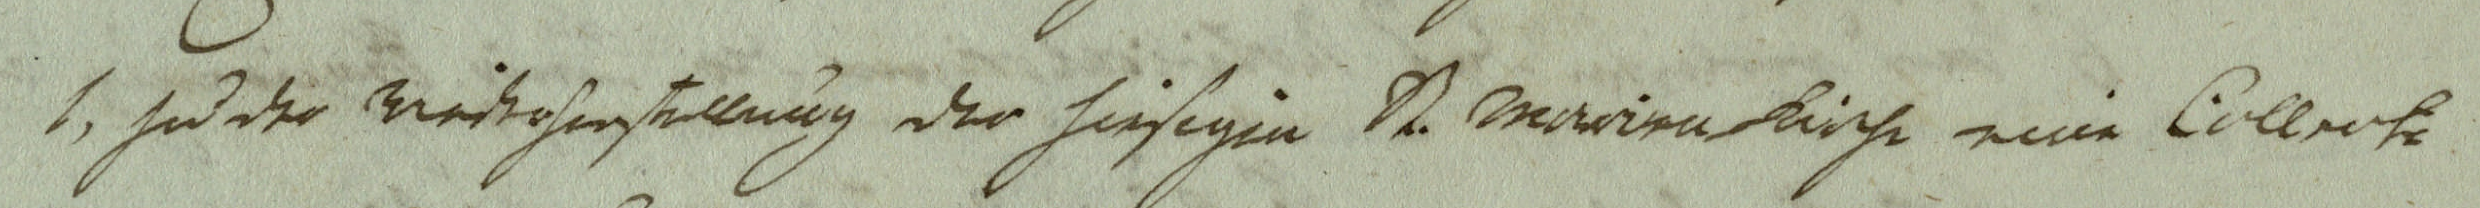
1, zu der Wiederherstellung der hiesigen St. Marienkirche eine Collecte
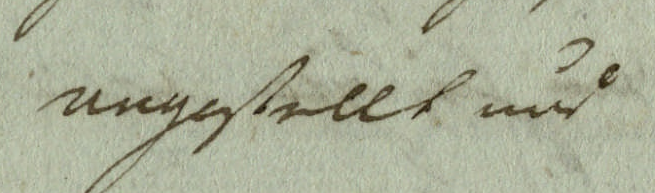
angestellt und
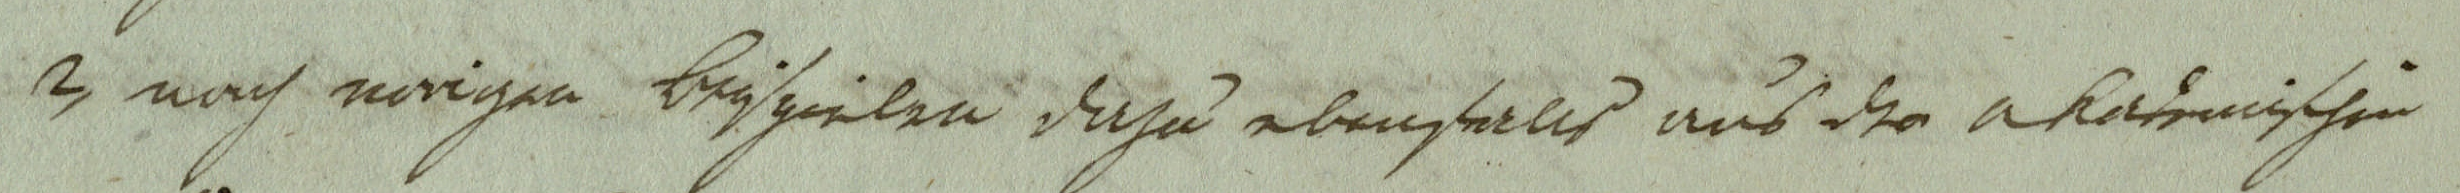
2, nach vorigen Beispielen dazu ebenfalls aus der akademischen
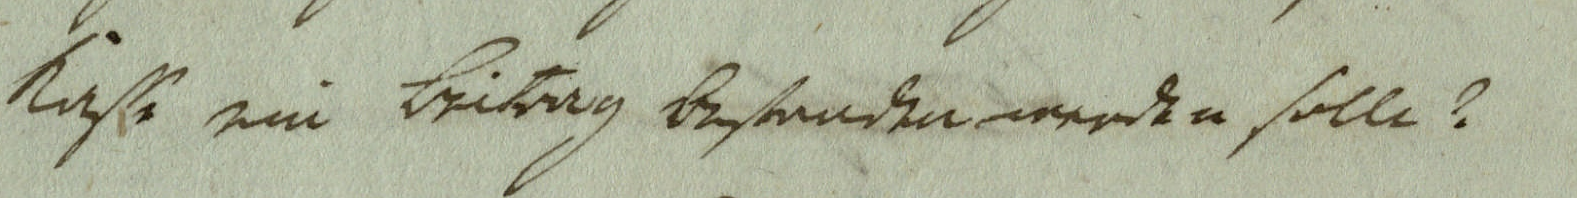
Kasse ein Beitrag bestanden werden solle?
